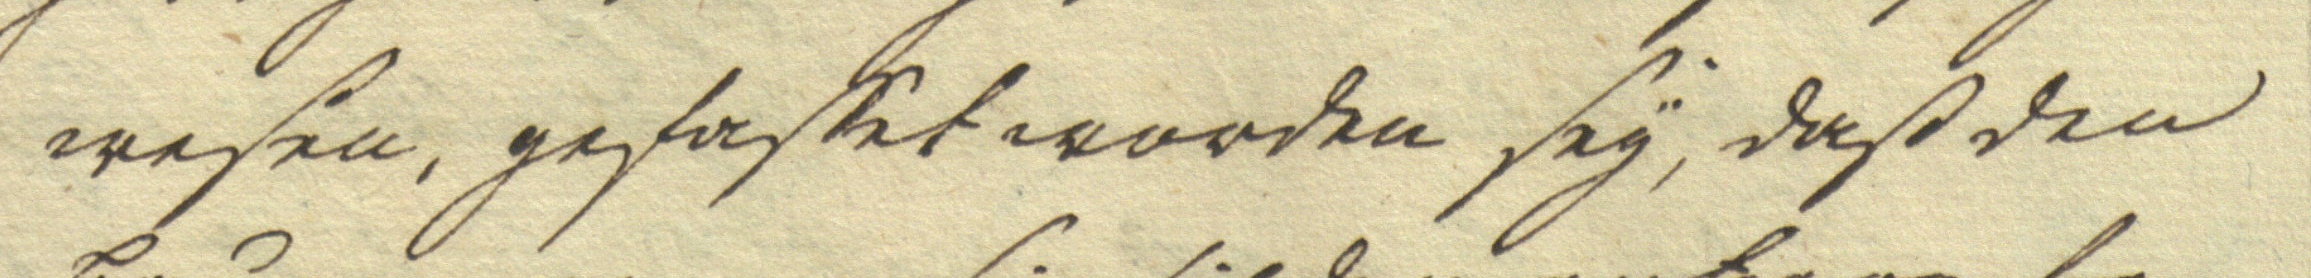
wesen, gefasset worden seÿ, daß den
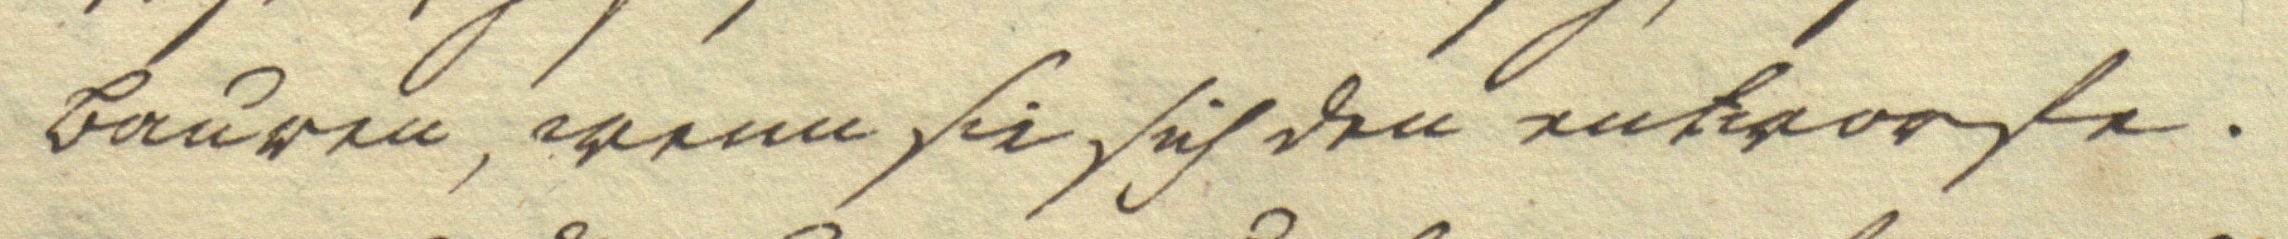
Bauren, wenn sie sich den entworfe¬
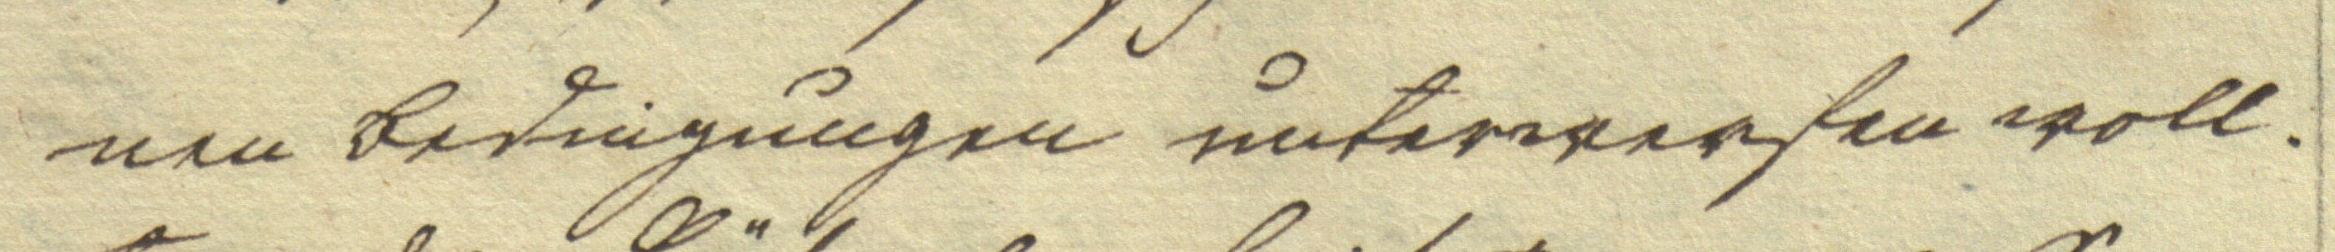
nen Bedingungen unterwerfen woll¬
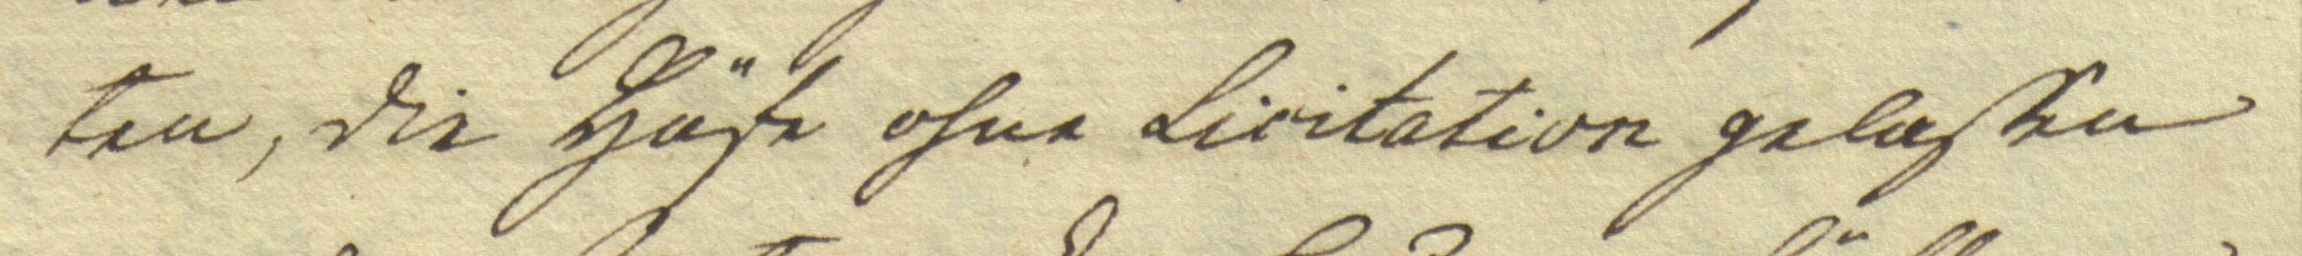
ten, die Höfe ohne Licitation gelassen
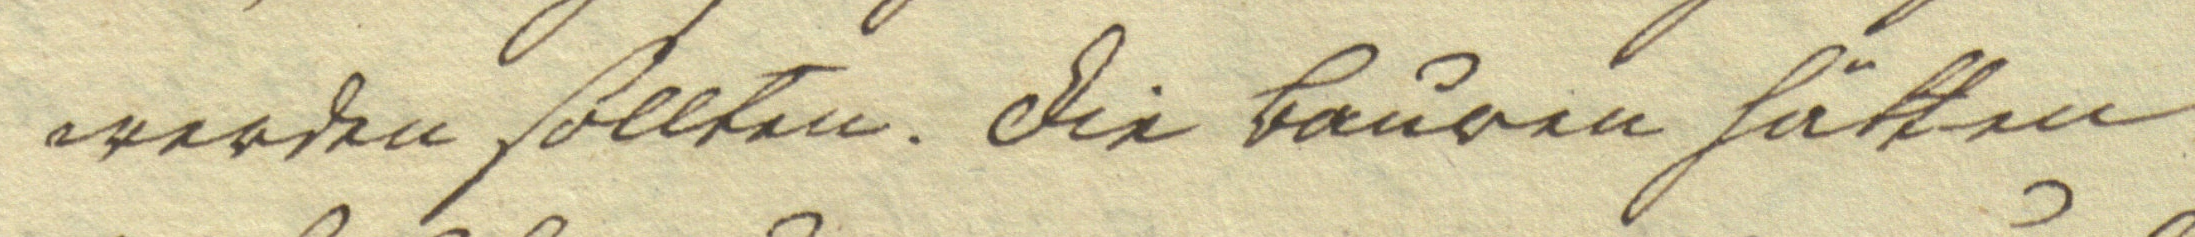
werden sollten. Die Bauren hätten
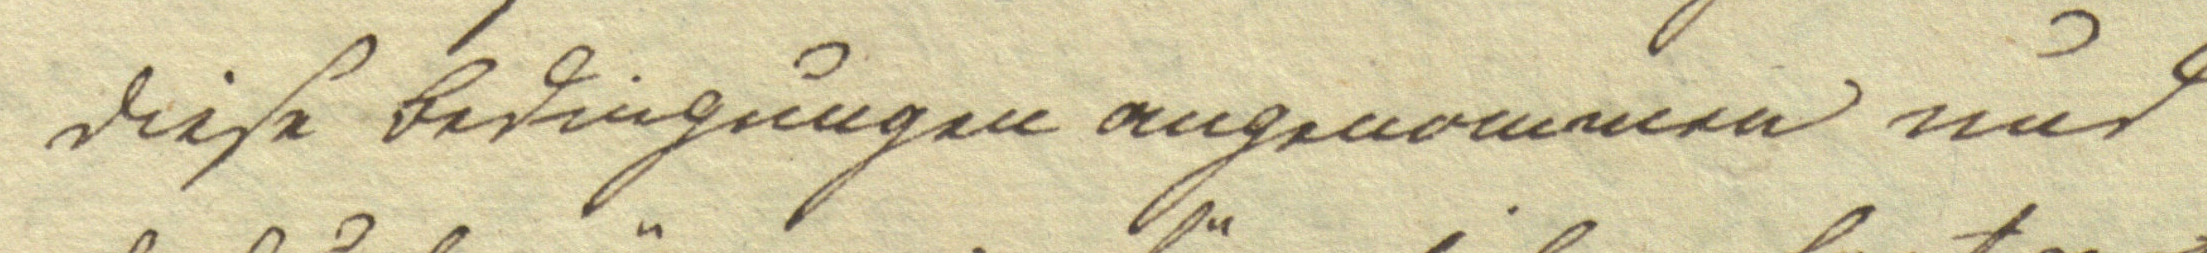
diese Bedingungen angenommen und
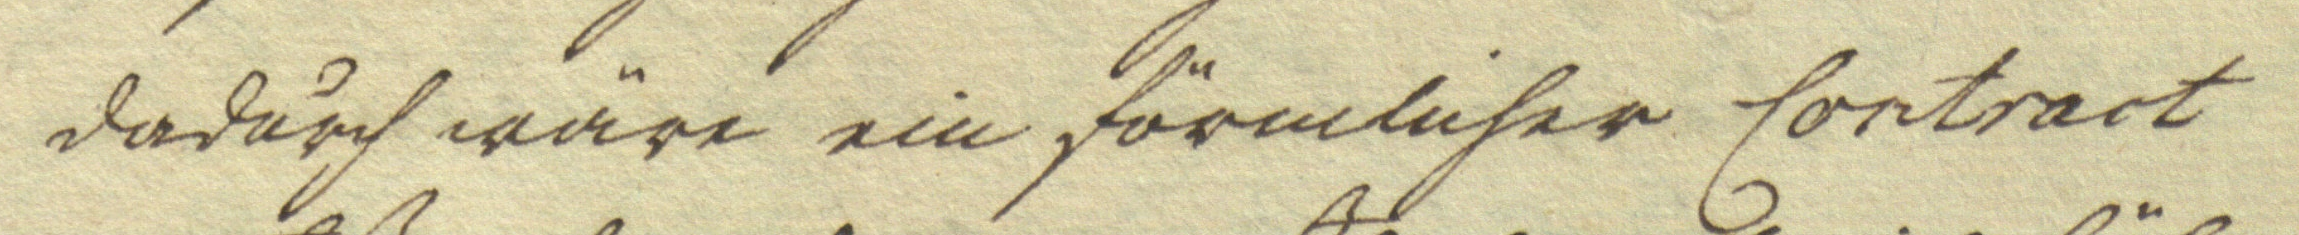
dadurch wäre ein förmlicher Contract
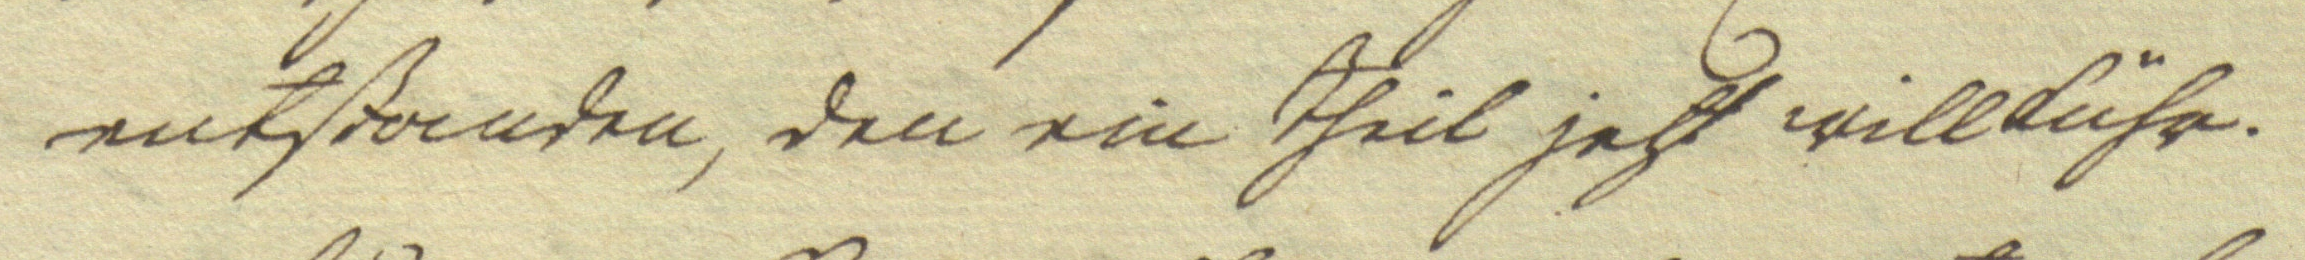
entstanden, den ein Theil jetzt willkühr¬
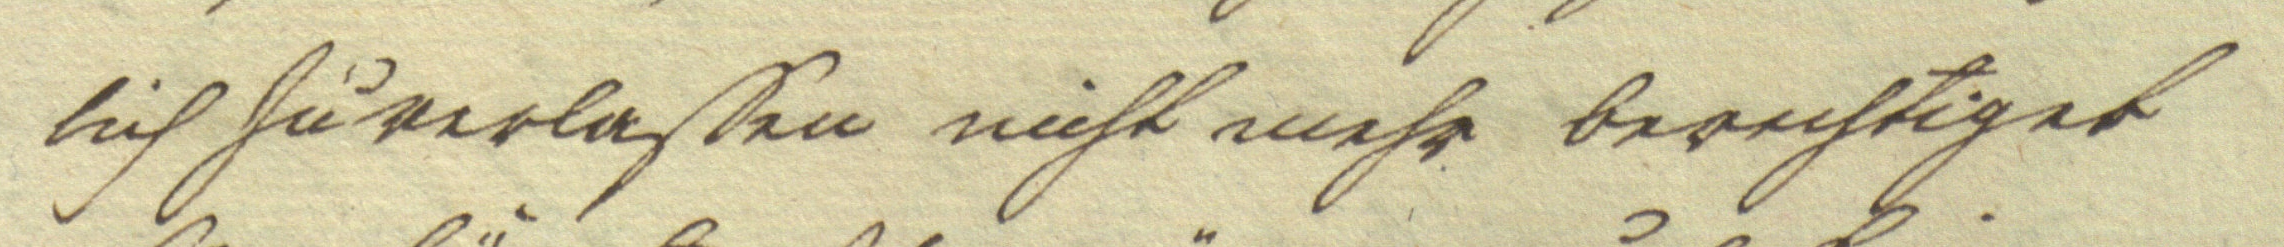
lich zu verlassen nicht mehr berechtiget
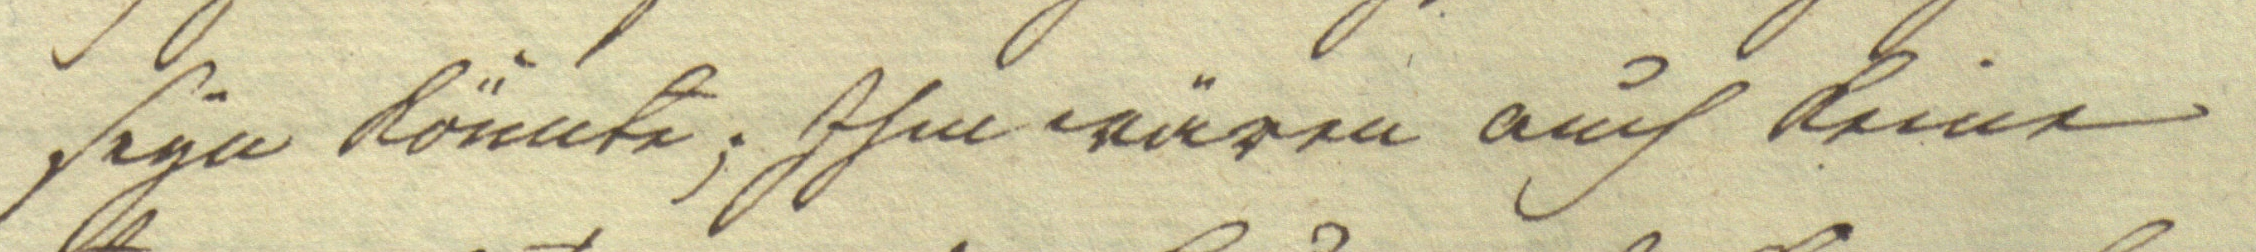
seÿn könnte; Ihm wären auch keine
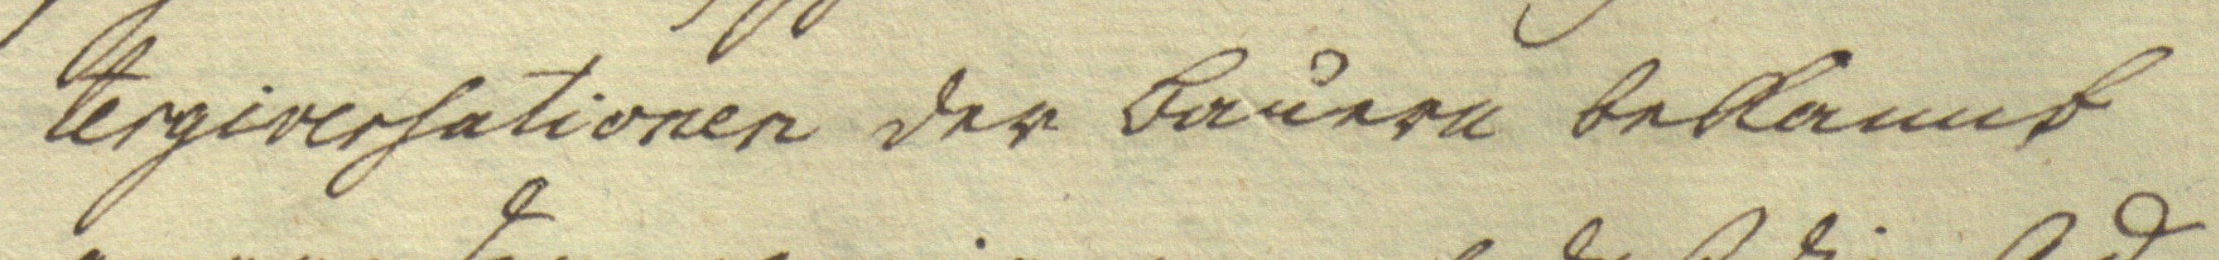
tergiversationen der Bauern bekannt
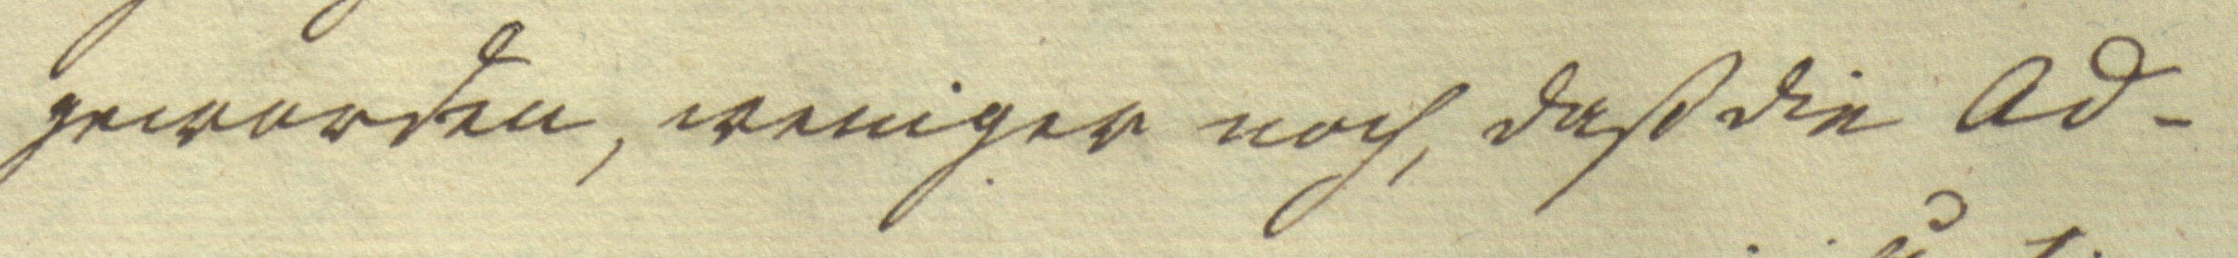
geworden, weniger noch, daß die Ad¬
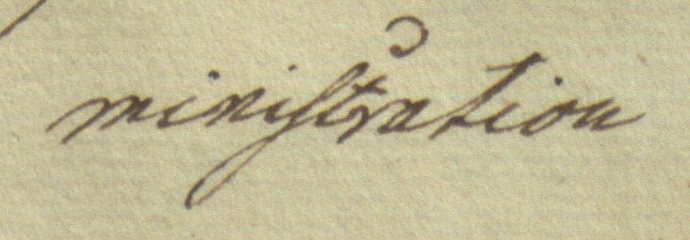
ministration
